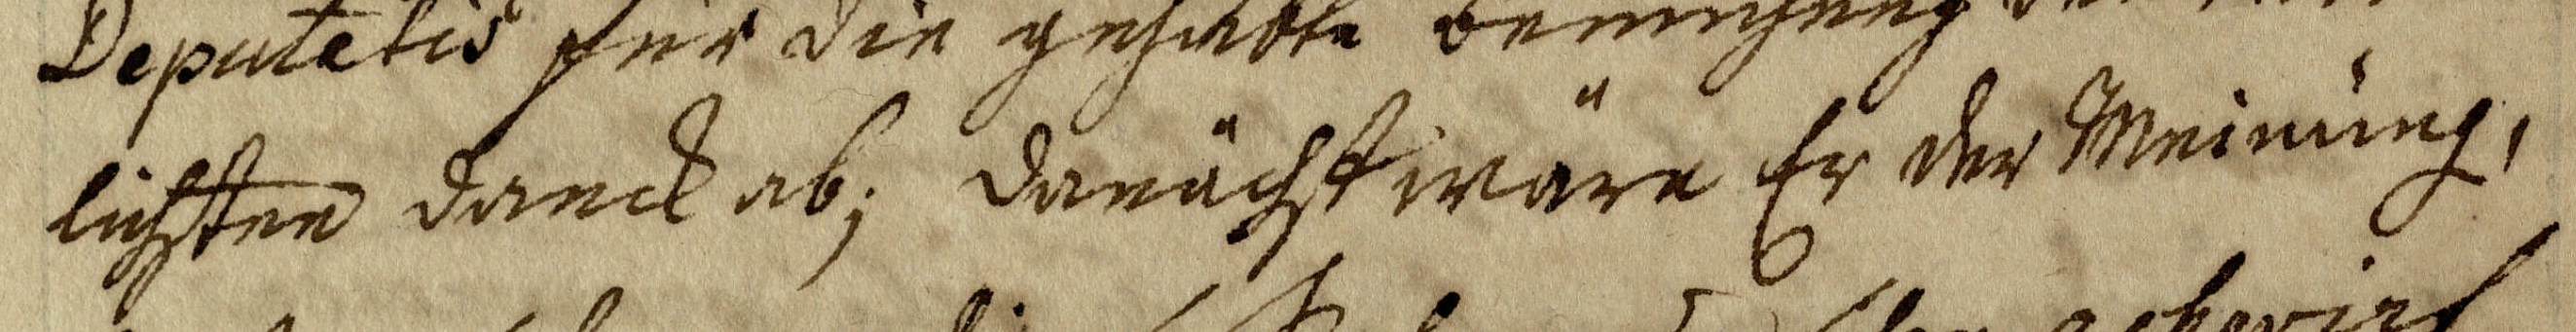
lichsten Dank ab; danächst wäre Er der Meinung,
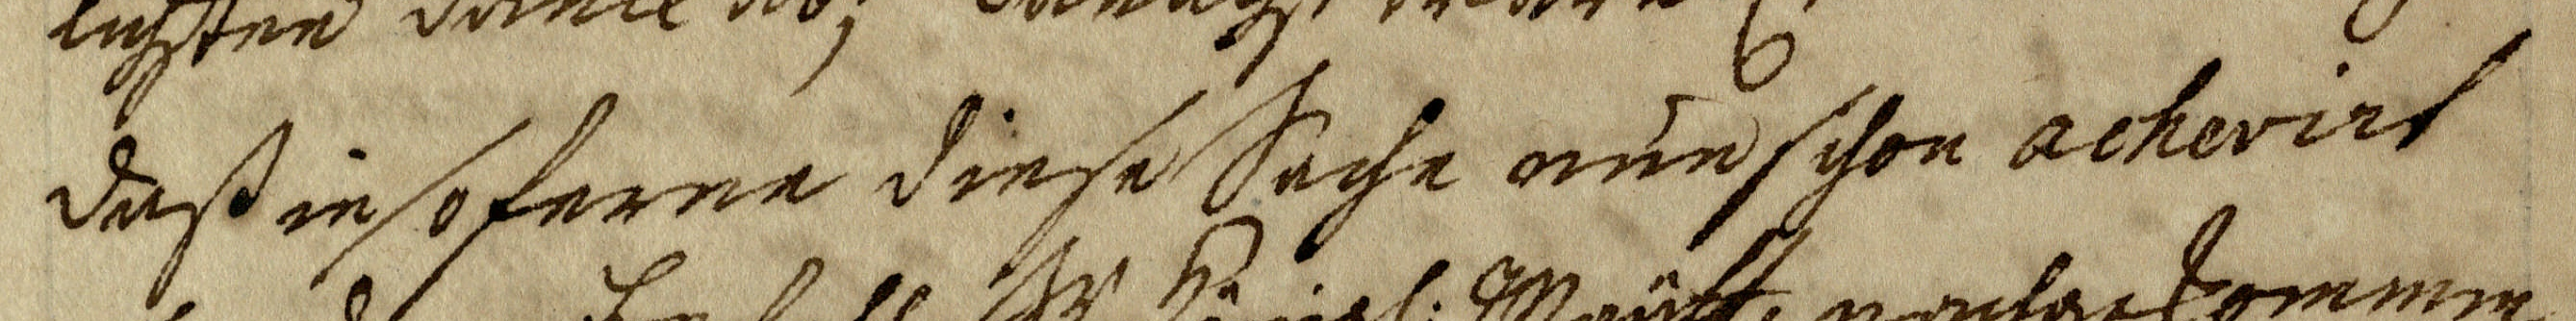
daß in soferne diese Sache nun schon achevirt
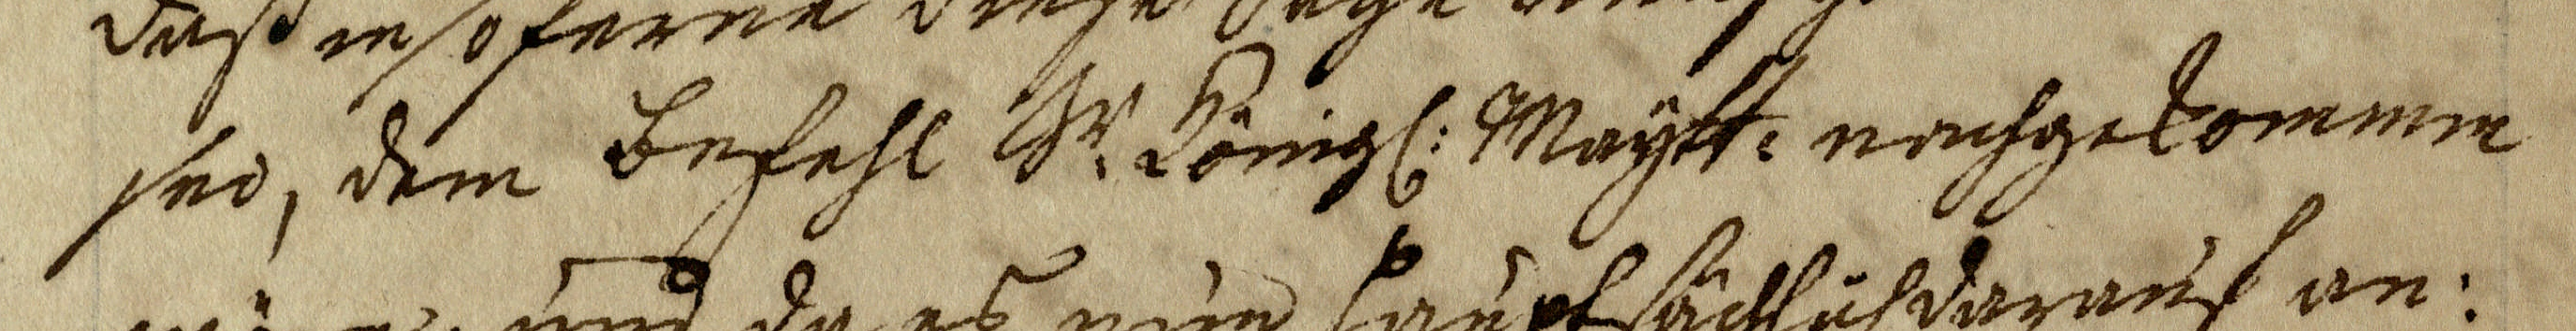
sei, dem Befehl Sr. Königl. Maÿtt. nachgekommen
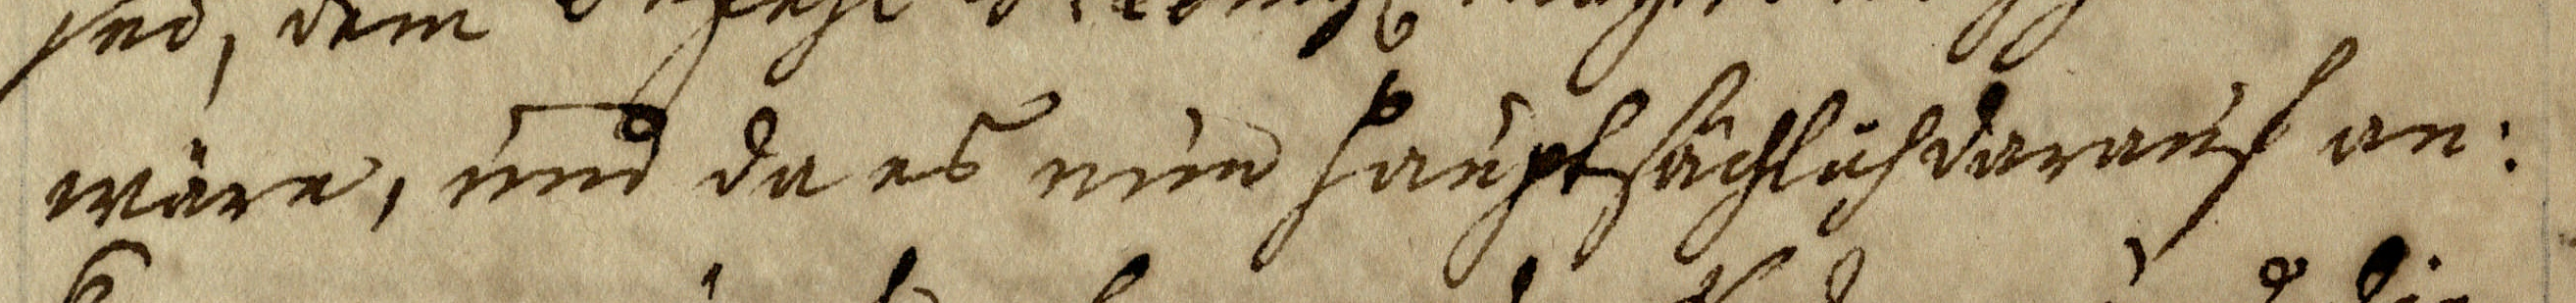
wäre, und da es nun hauptsächlich darauf an¬
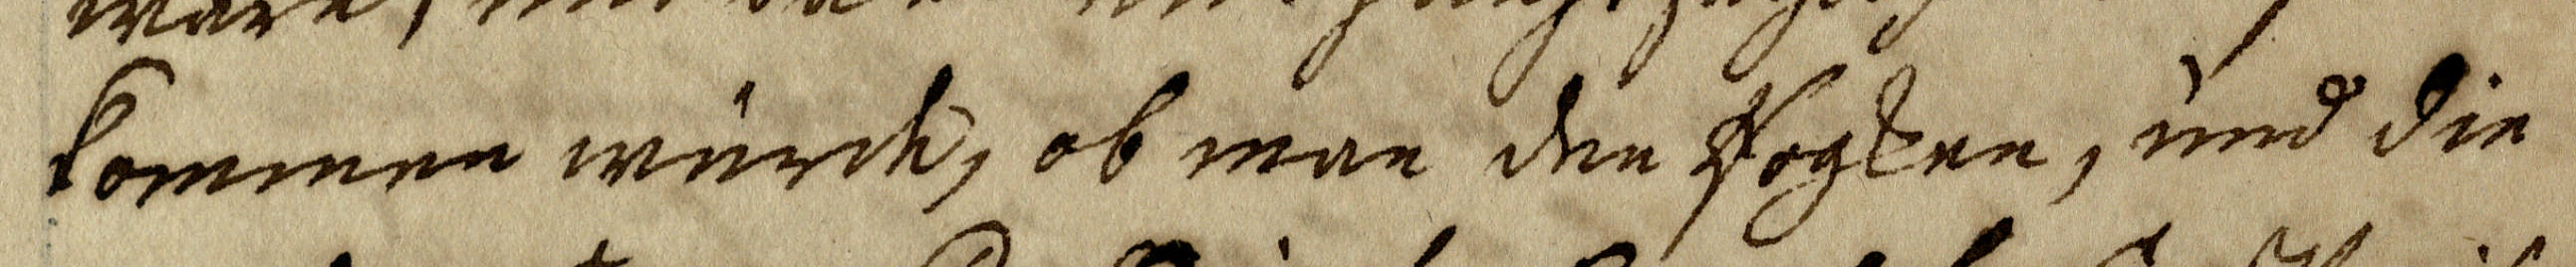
kommen würde, ob man den Rogken, und die
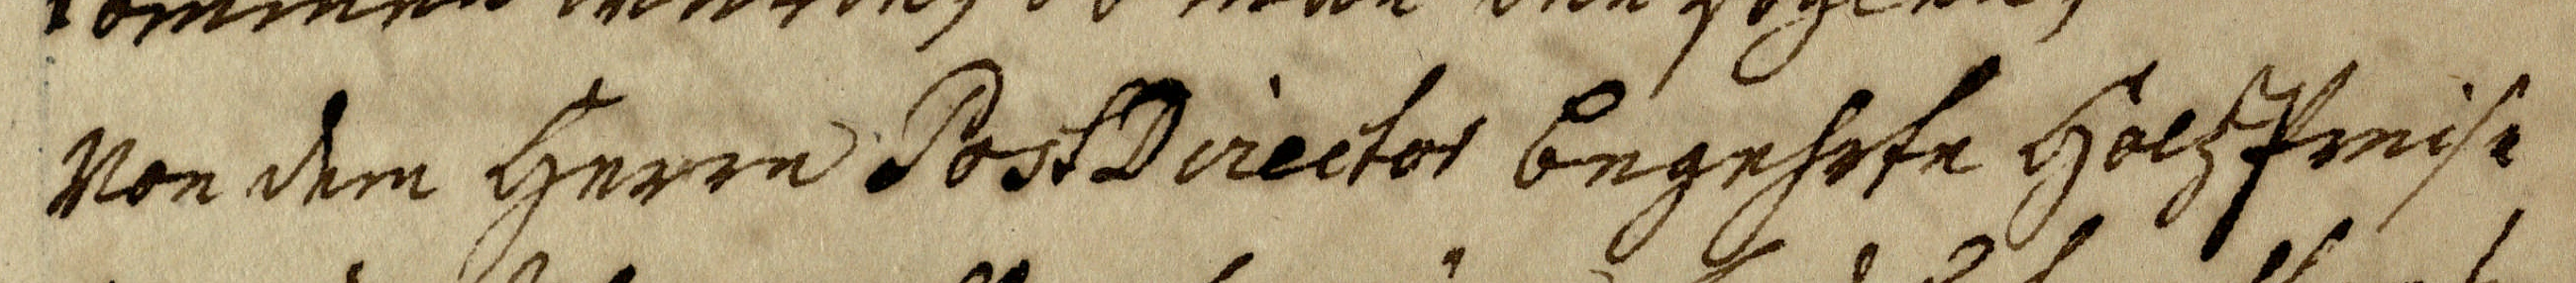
von dem Herrn Prof Director begehrte HolzPreise¬
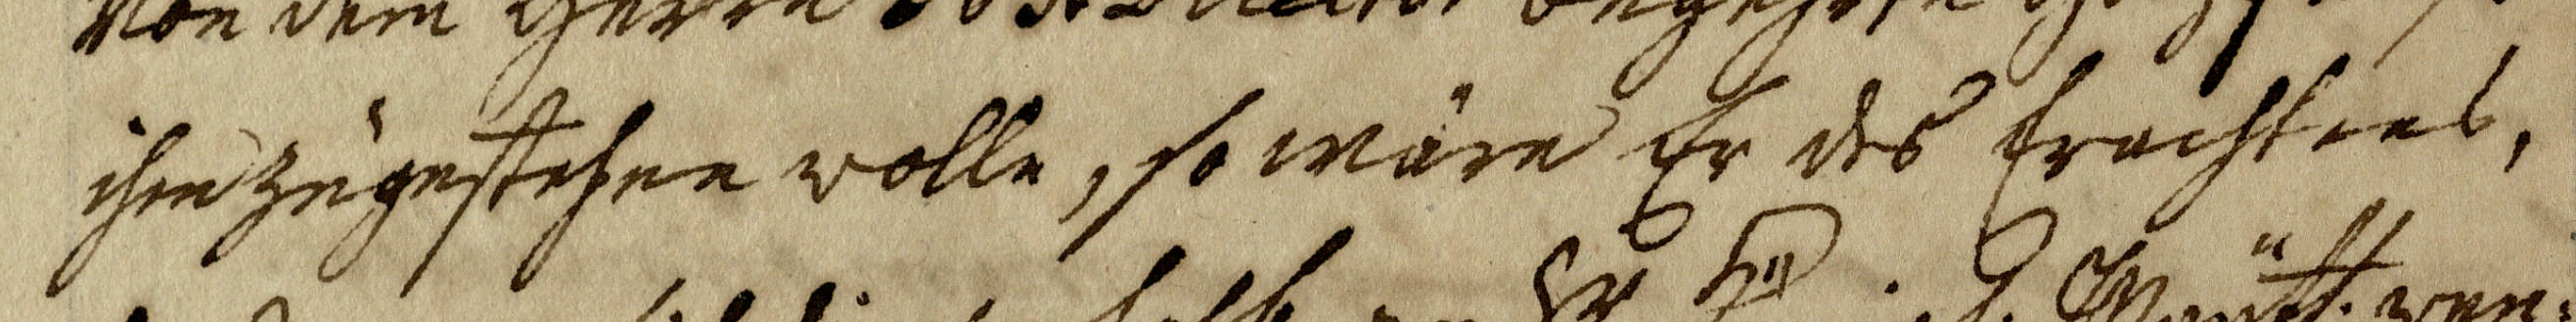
ihm zugestehen wolle, so wäre Er des Erachtens,
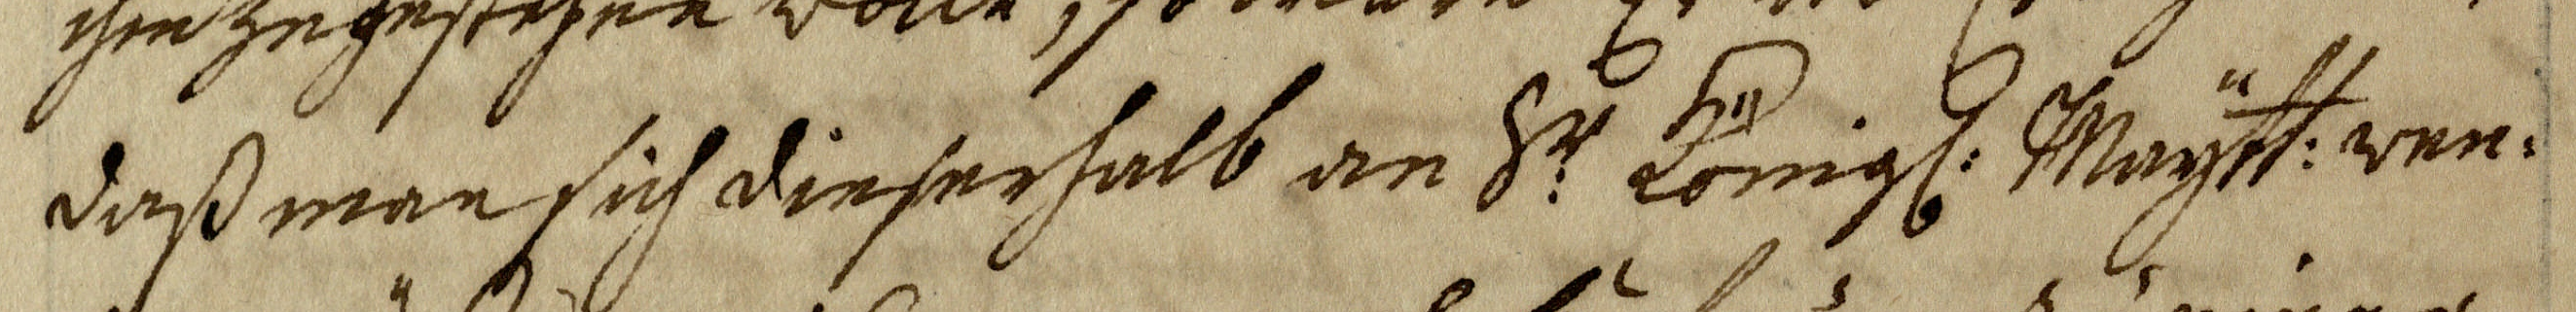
daß man sich dieserhalb an Sr. Königl. Maÿtt. wen¬
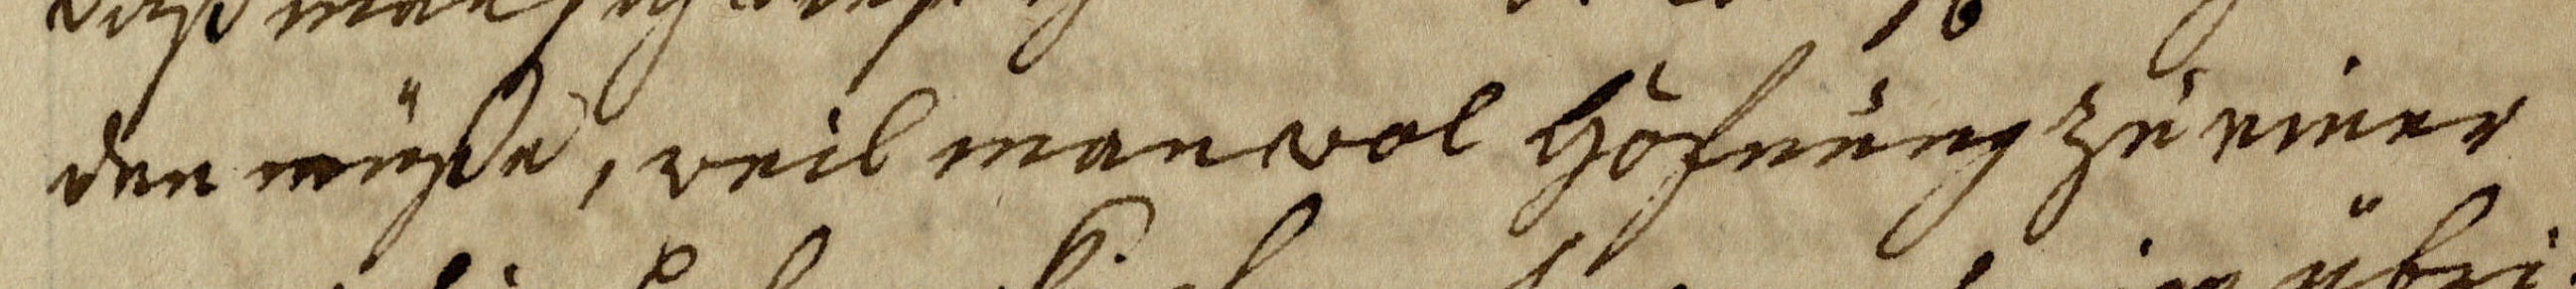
den müße, weil manwol Hofnung zu einer
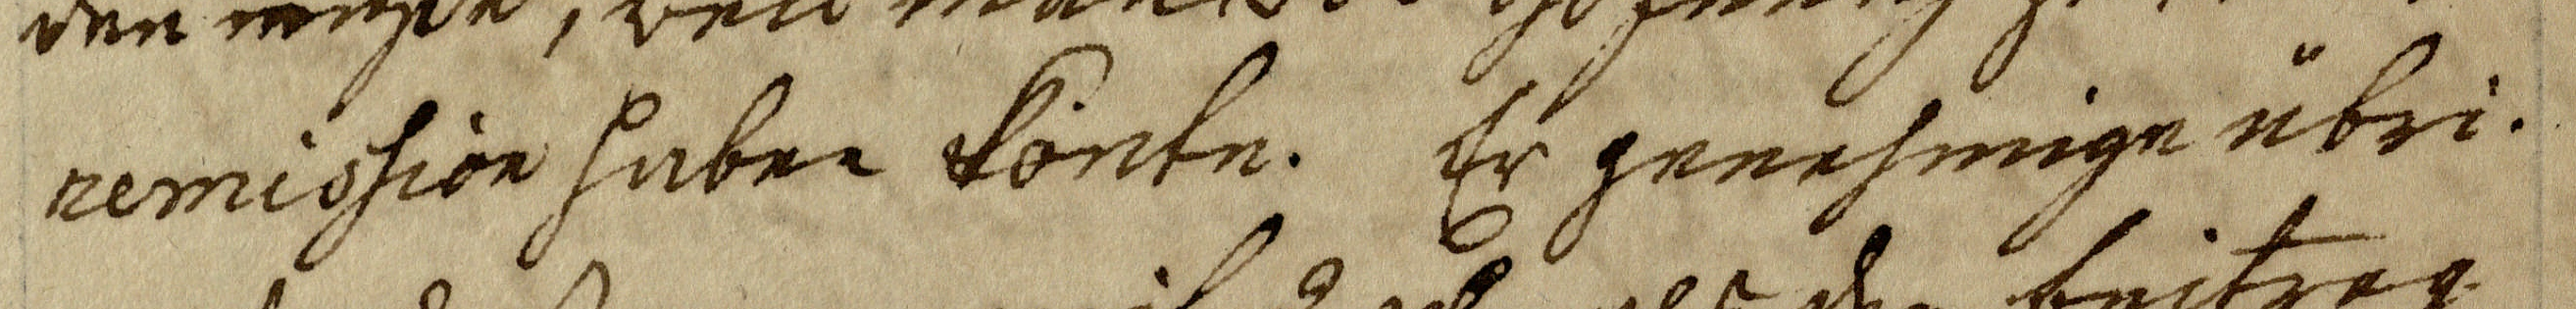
remission haben könte. Er genehmige übri¬
